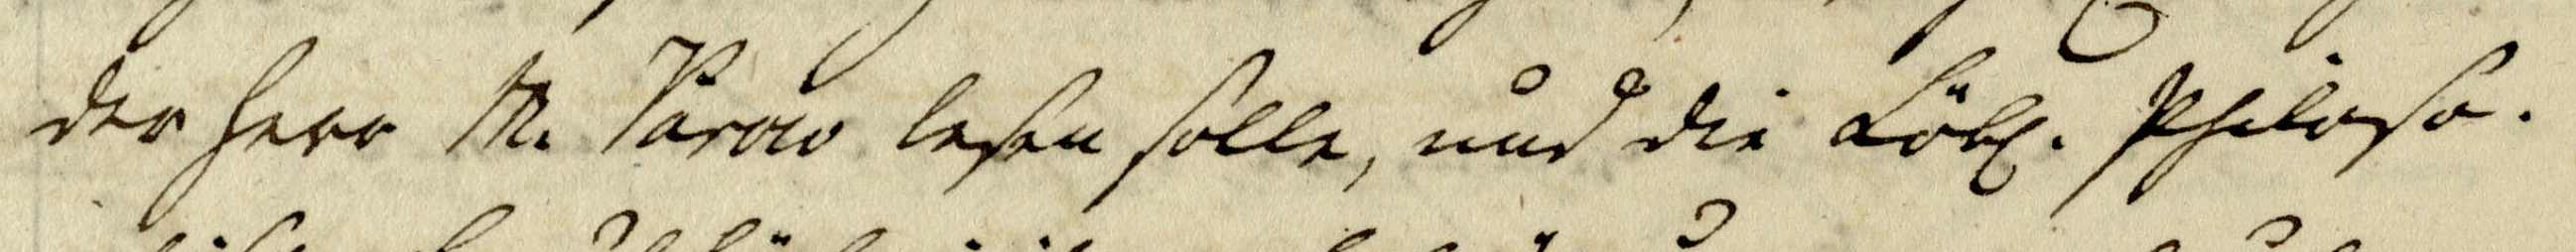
der Herr M. Parow lesen solle, und die Löbl. Philoso¬
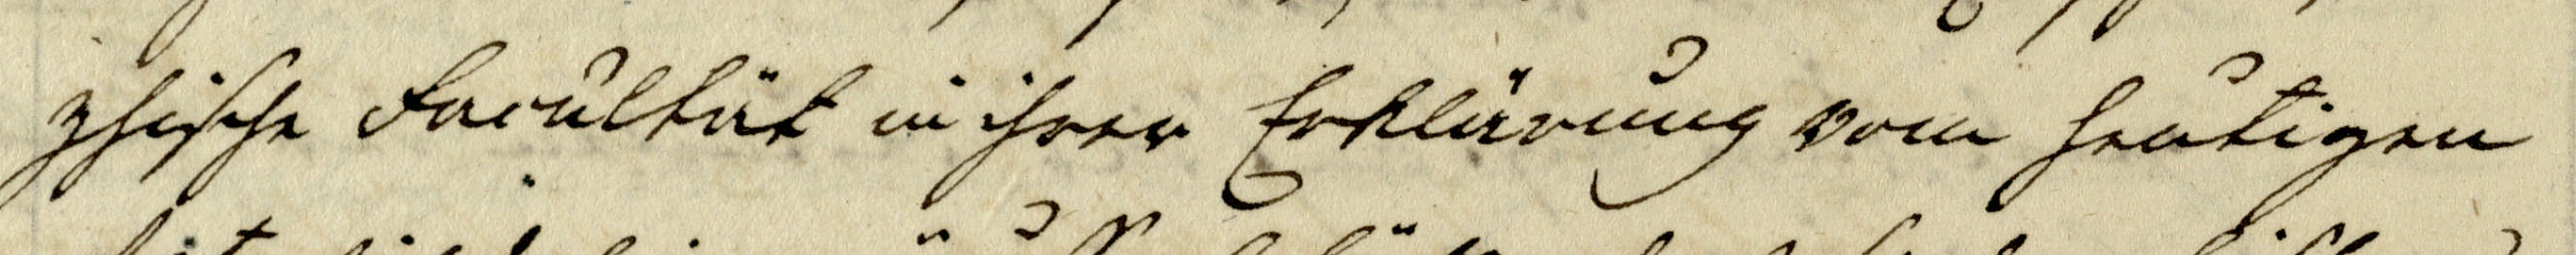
phische Facultät in ihrer Erklärung vom heutigen
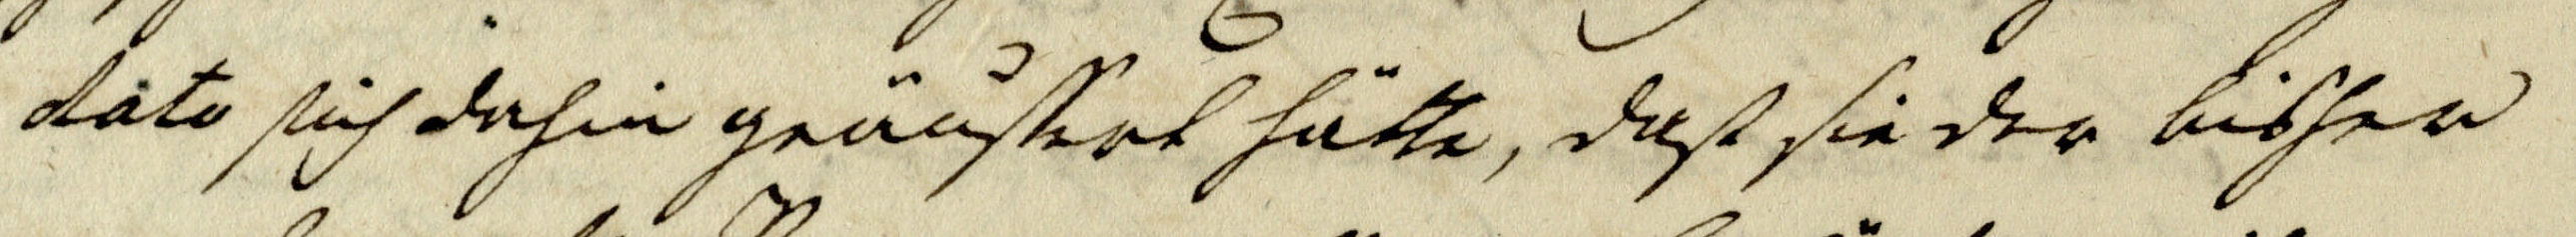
dato sich dahin geäussert hätte, daß sie der bisher
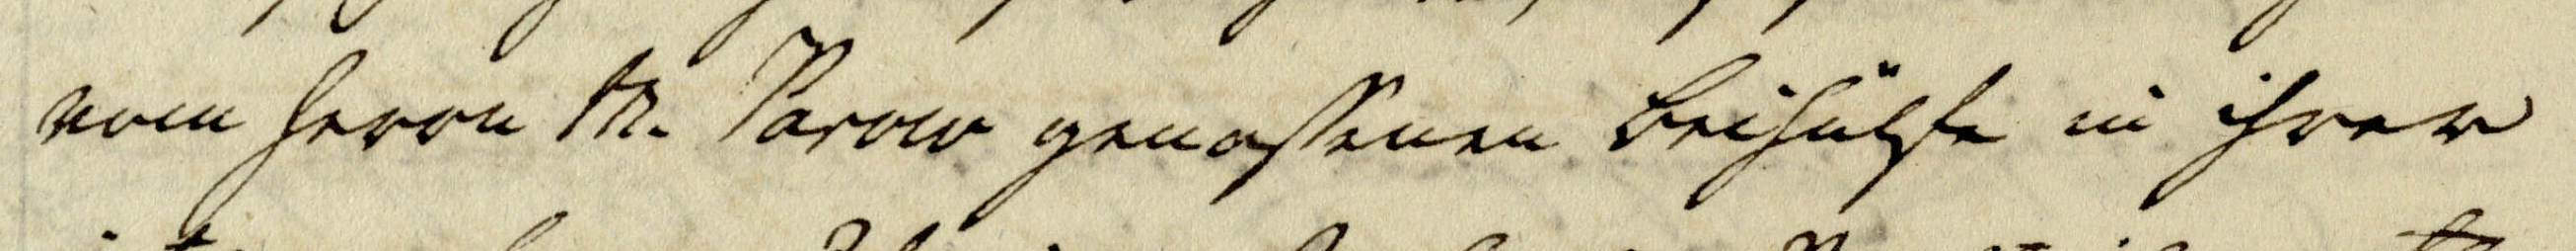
vom Herrn M. Turow genossenen Beihülfe in ihrer
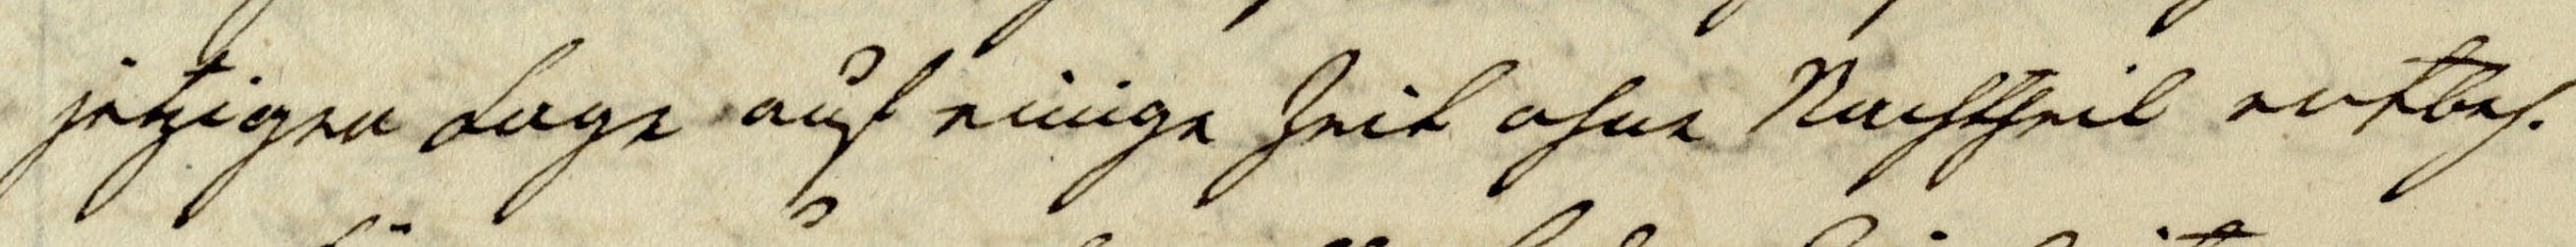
jetzigen Lage auf einige Zeit ohne Nachtheil entbeh¬
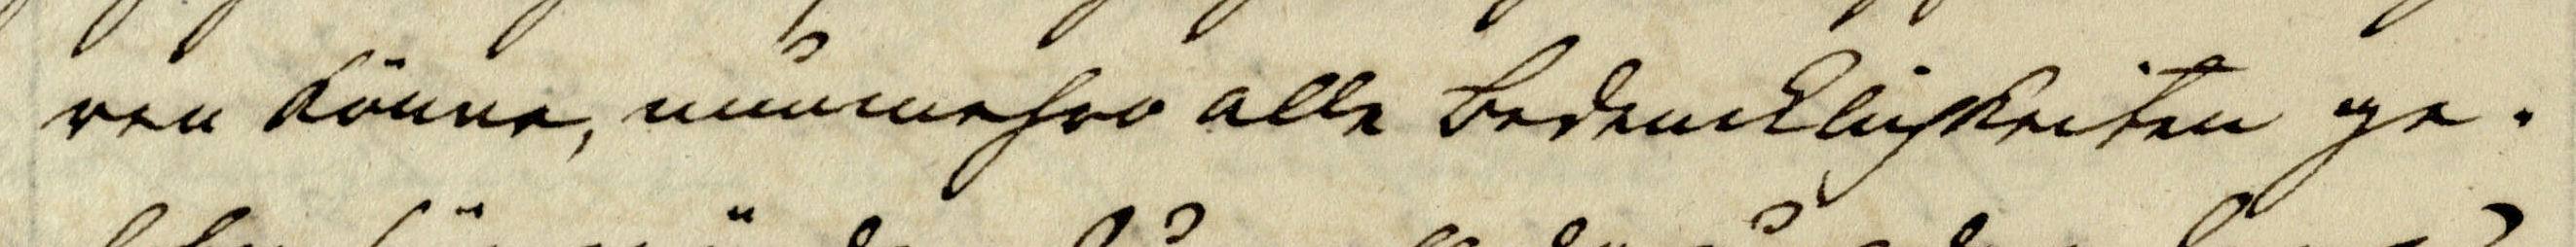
ren könne, nunmehro alle Bedencklichkeiten ge¬
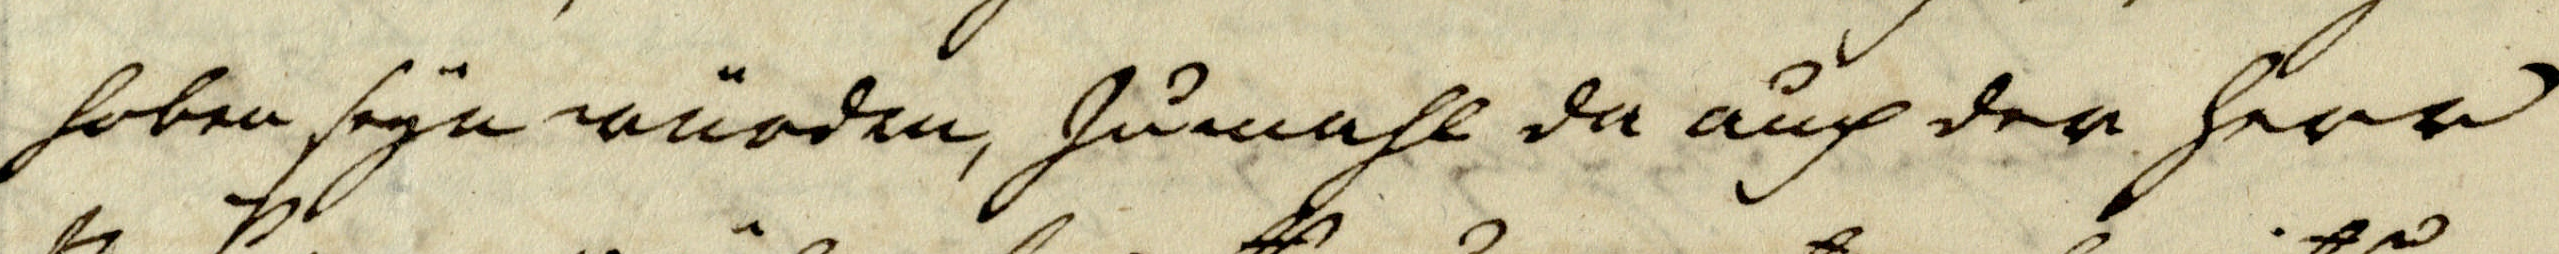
hoben seÿn würden, zumahl da auch der Herr
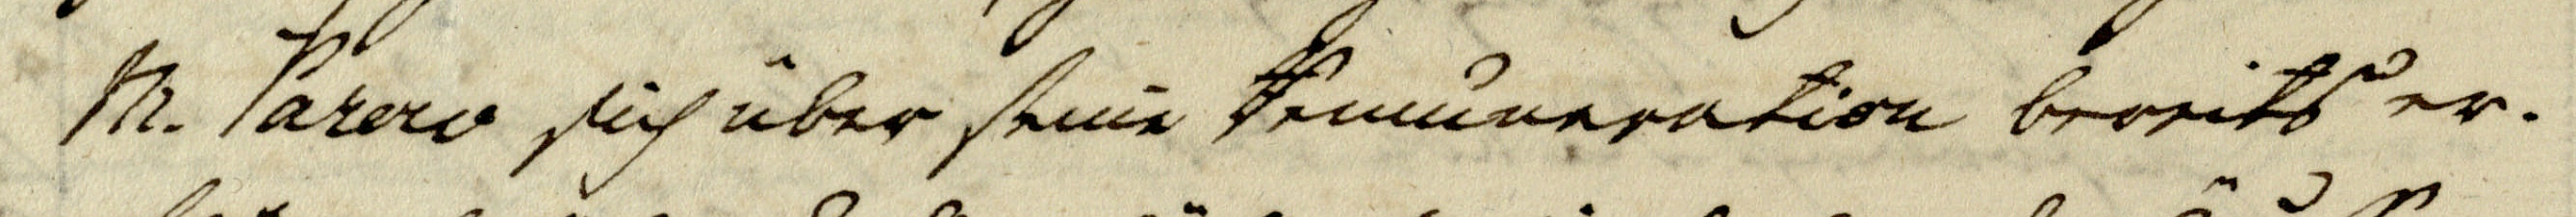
M. Parow sich über seine Remuneration bereits er¬
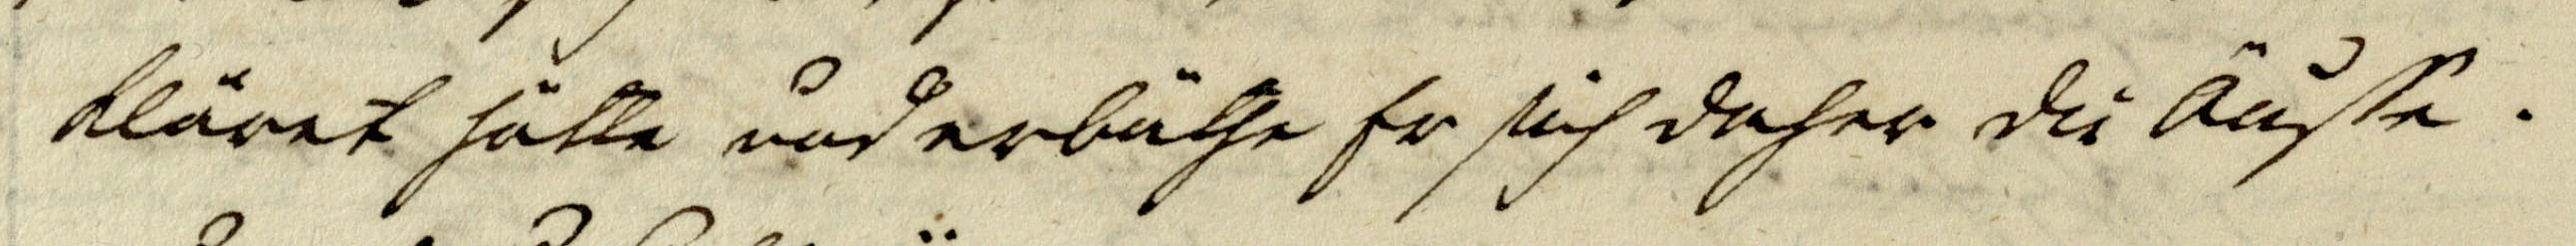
kläret hätte und erbäthe Er sich daher die Äusse¬
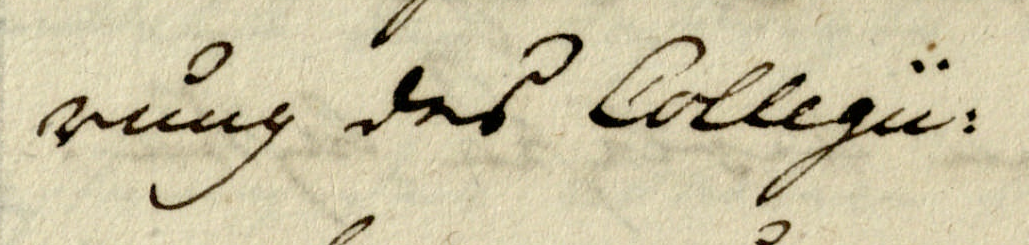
rung des Collegii:
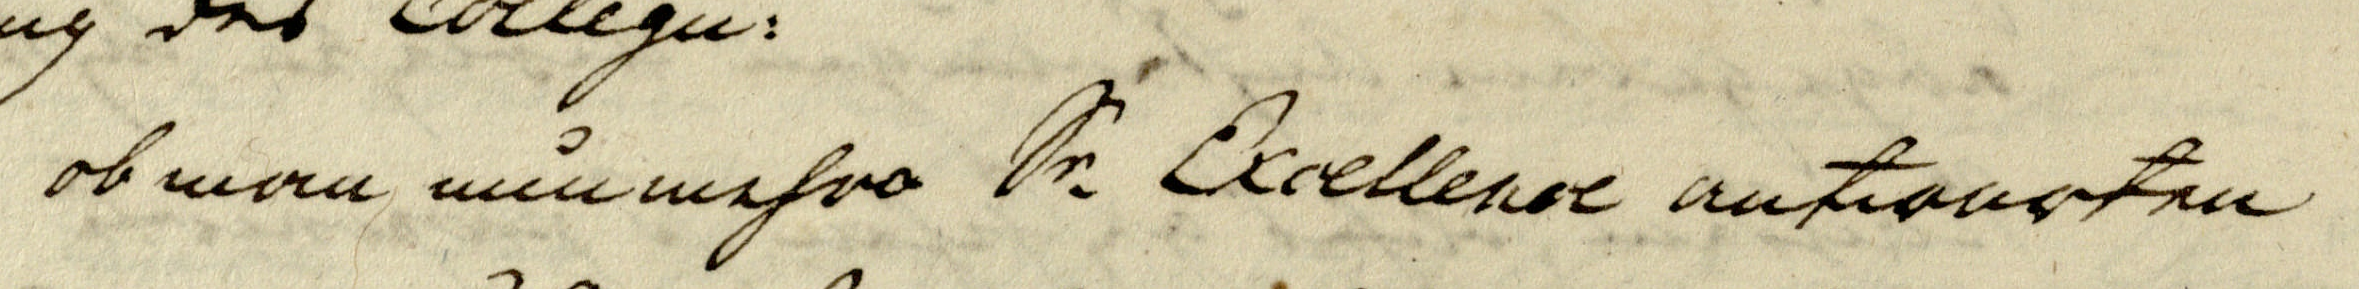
ob man nunmehro Sr Excellence antworten
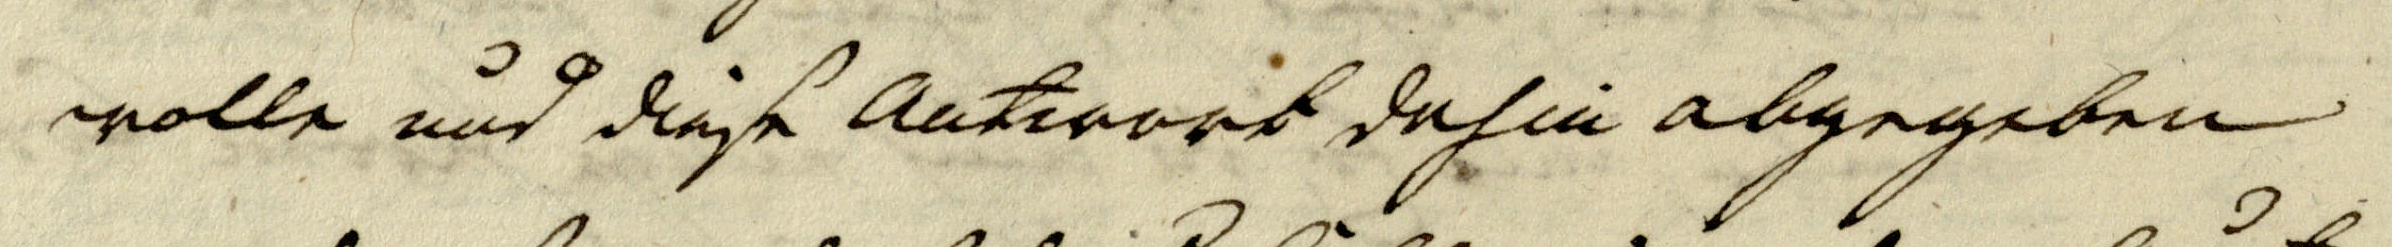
wolle und diese Antwort dahin abgegeben
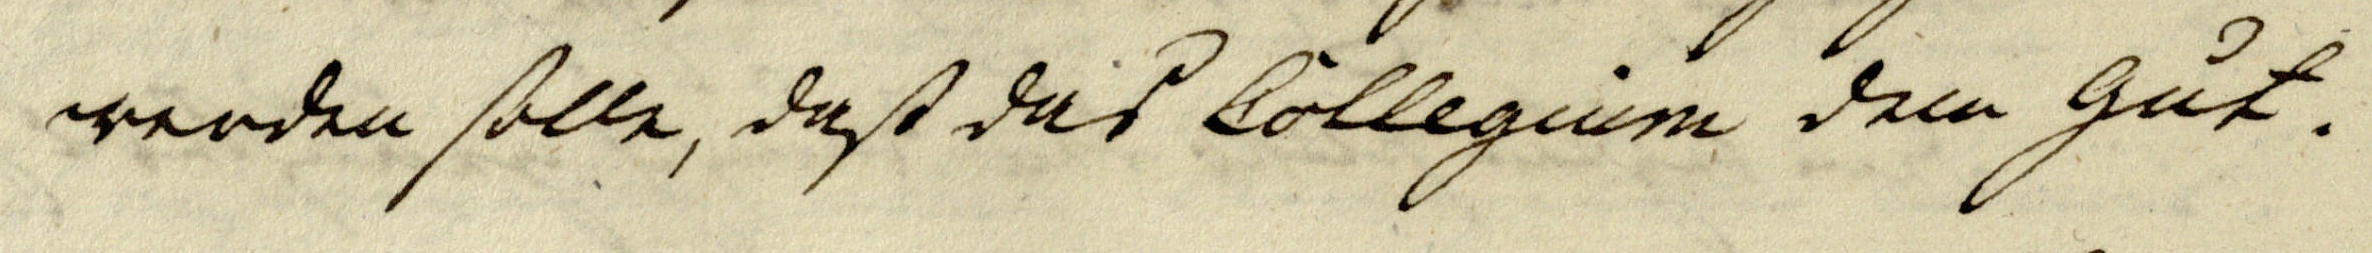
werden solle, daß das Collegium dem Gut¬
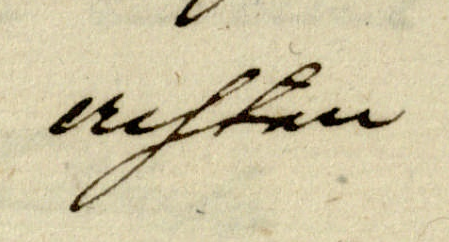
achten
